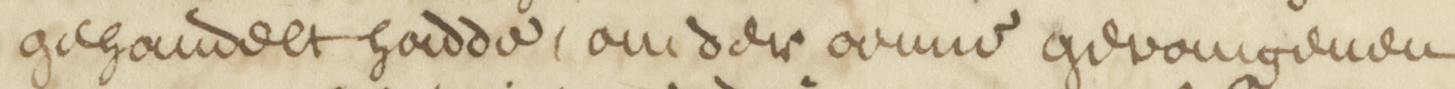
gehandelt hadde, om der arme gevangenen
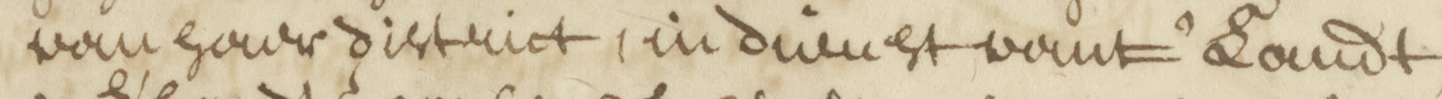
van haer district, in dienst vant‛ Landt,
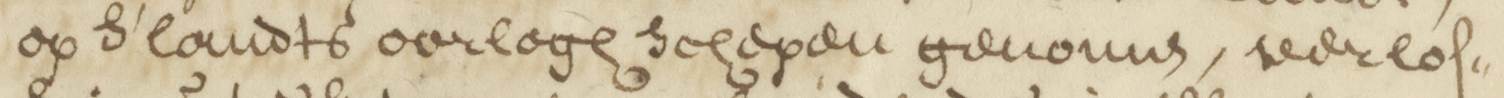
op s'landts oorlogh schepen genomen, verlos,,
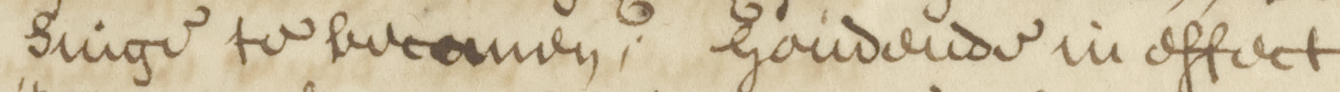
„singe te becomen; houdende in effect
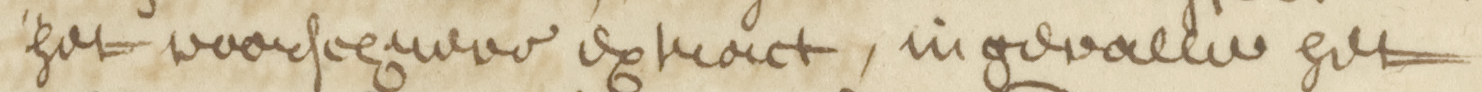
het voorschreve extract, ingevalle het
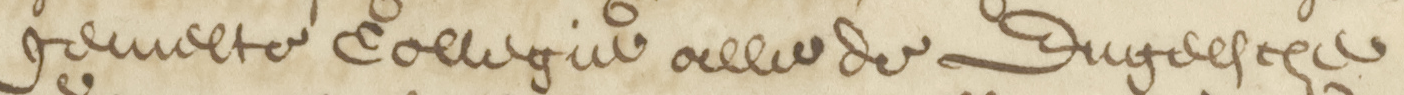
gemelte Collegie alle de Engelsche —
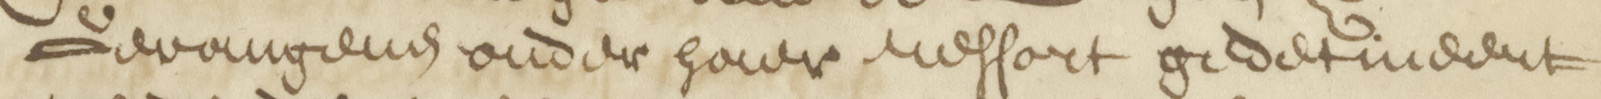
Gevangenen onder haer ressort gedetineert
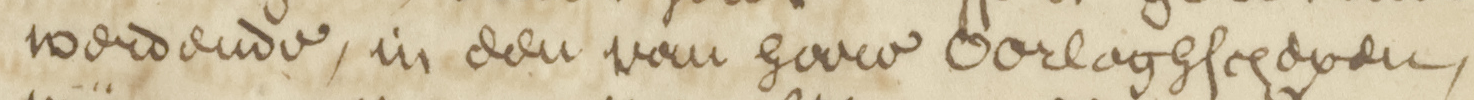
werdende, in een van hare Oorloghschepen,
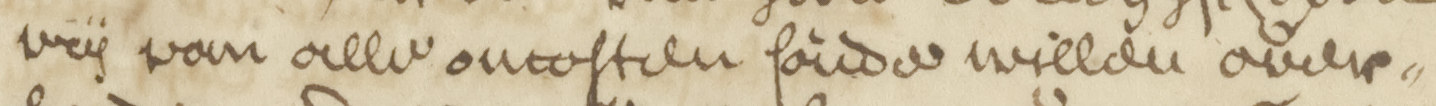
vrij van alle oncosten soude willen over„
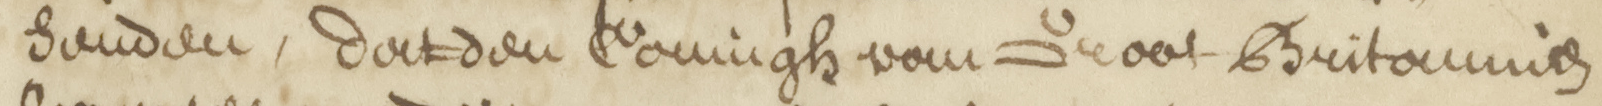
senden, dat den Coningh van Groot Britannien
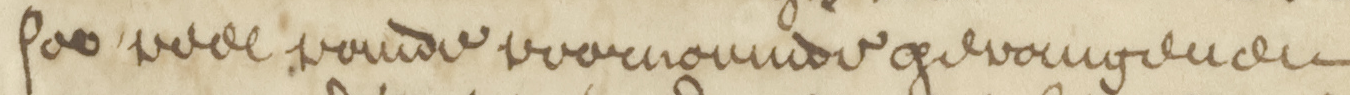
soo veel vande vernoemde gevangenen
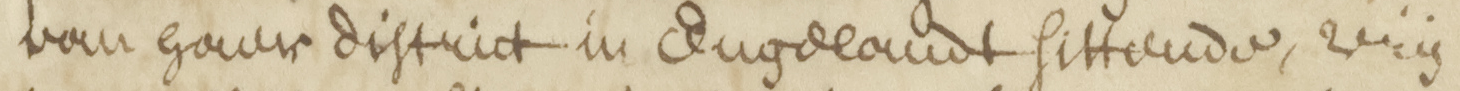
van haer district in Engelandt sittende, vrij
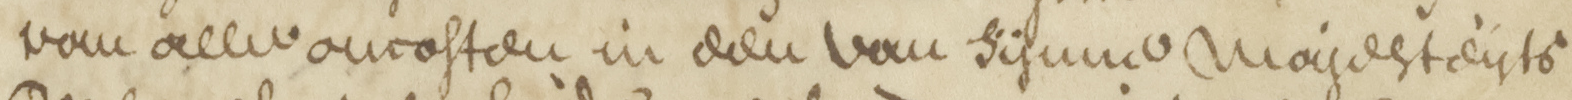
van alle oncosten in een van Sijnne Majesteijts
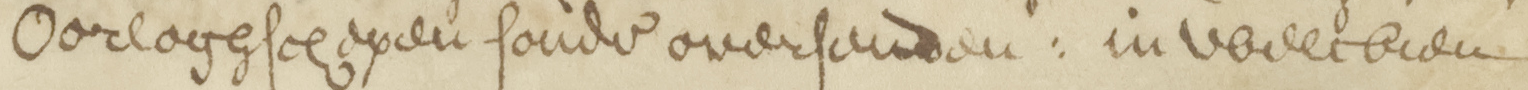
Oorloghschepen soude oversenden: in welcken
